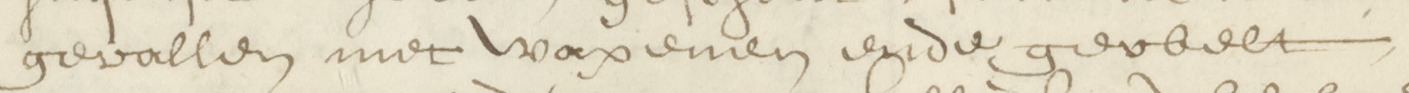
gevallen met wapenen ende gewelt
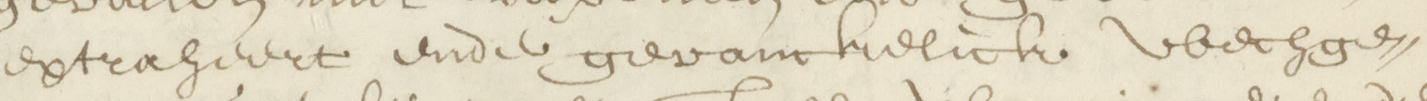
extraheert ende gevanckelick wechge„
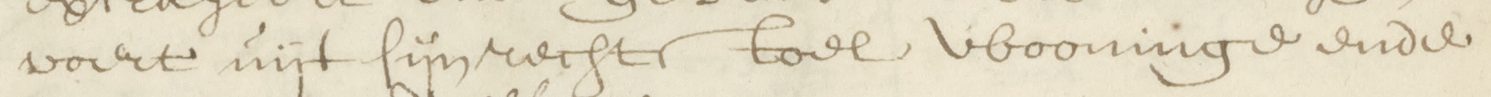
voert uijt sijn rechtstoel, wooninge ende
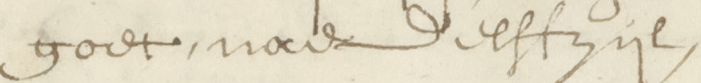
goet, naer Delffzijl.
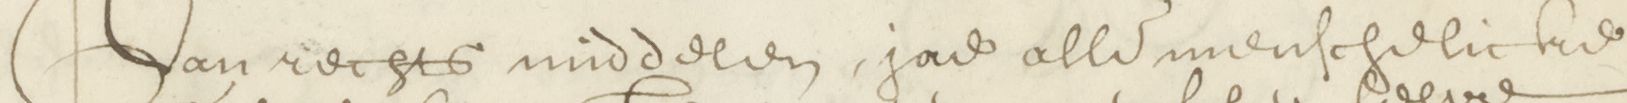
Van rechts middelen, jae alle menschelicke
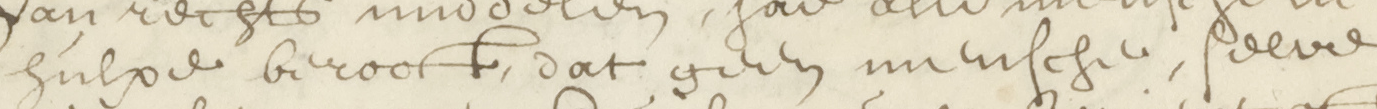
hulpe berooft, dat geen mensche, selve
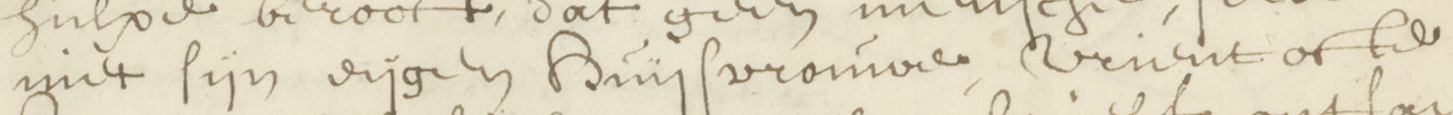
niet sijn eijgen Huijsvrouwe, vrient ofte
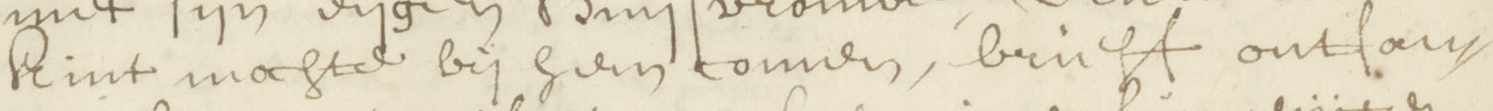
kint mochte bij hem comen, brieff ontfan,,
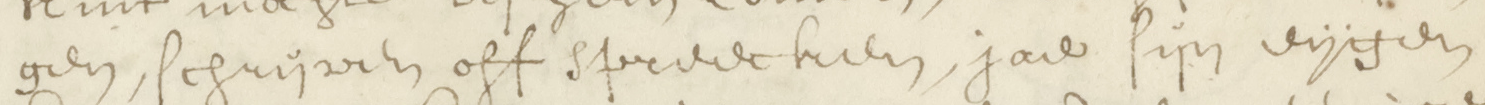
gen, schrijven off spreecken, jae sijn eijgen
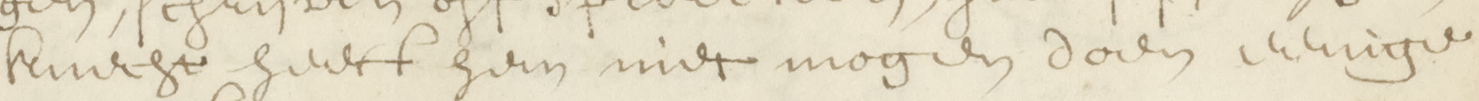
knecht heeft hem niet mogen doen eenige
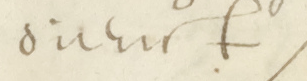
dienst.
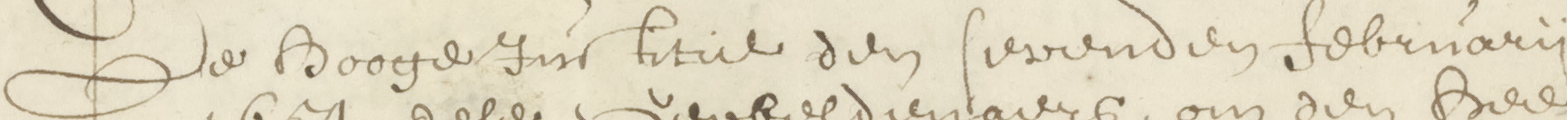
De hooge Justitie den sevenden februarij
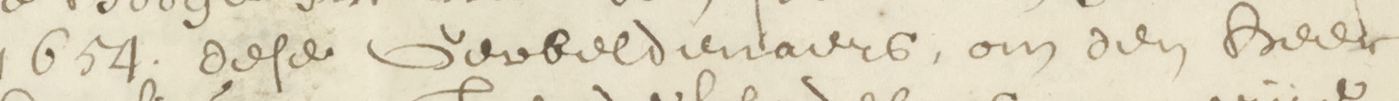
1654. dese Geweldenaers, om den heer
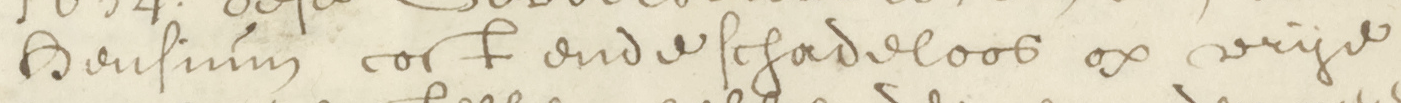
Hensium cost ende schadeloos op vrije
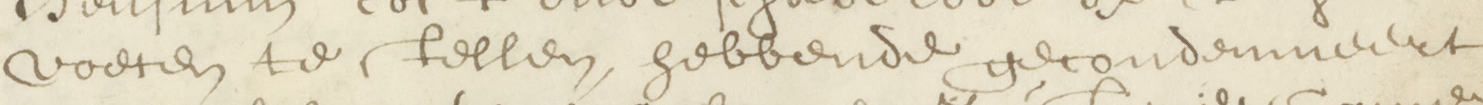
voeten te stellen, hebbende gecondemneert
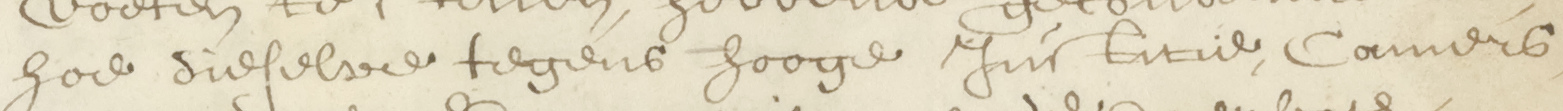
hoe dieselve tegens hooge Justitie, Camers,
